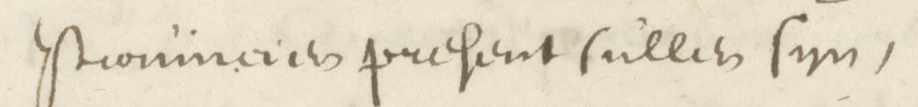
Prouincien present sullen syn.
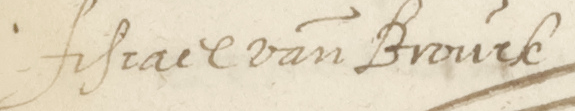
fiscael van Brouck
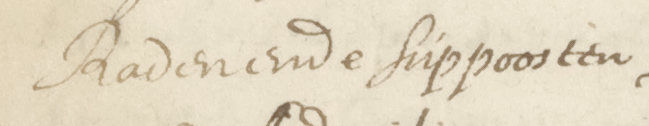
Raden ende suppoosten
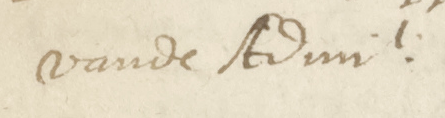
vande Admit.
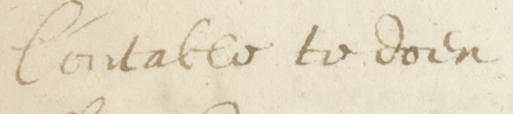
Contable te doen
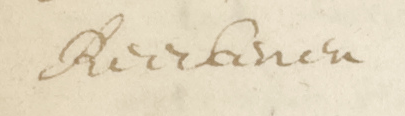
Reeckenen
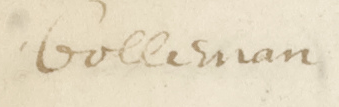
Bolleman
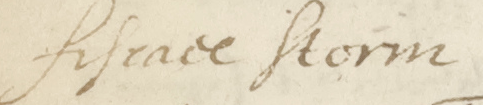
fiscael Storm
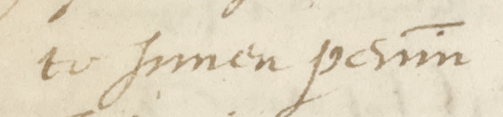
te Innen penin
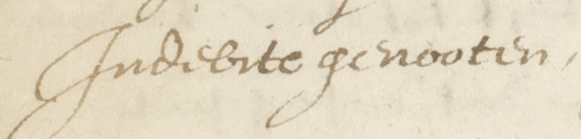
Indebite genooten.
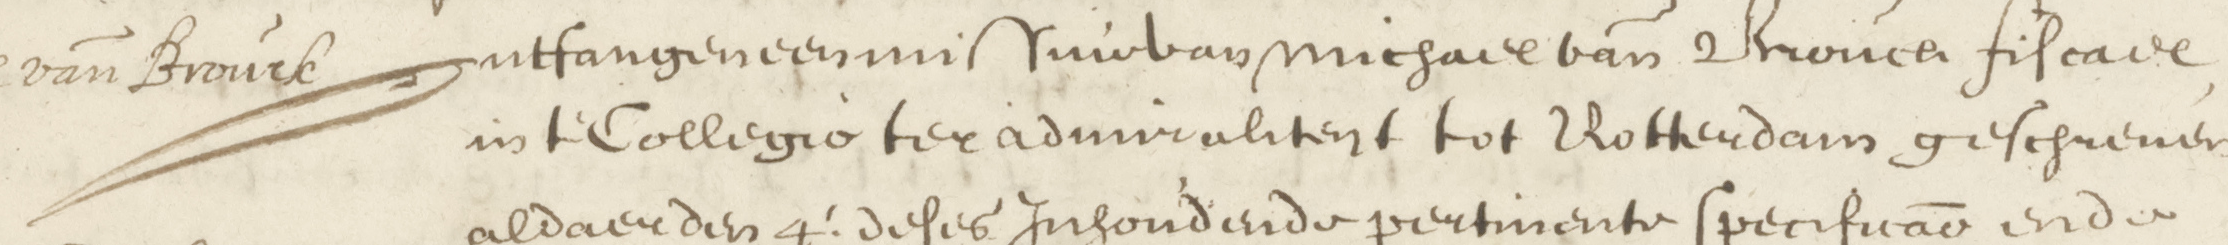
Ontfangen een missiue van Michael van Brouck fiscael
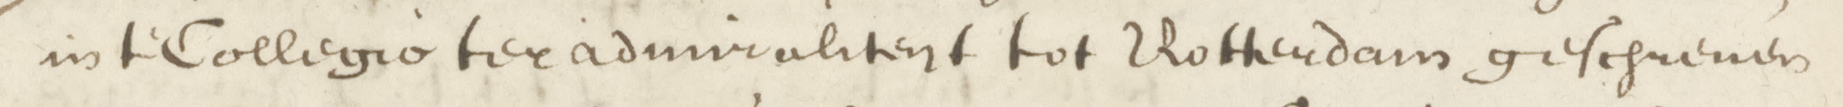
in t‛Collegie ter admiraliteyt tot Rotterdam geschreuen
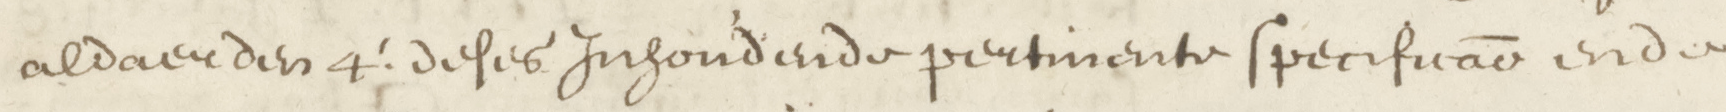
aldaer den 4e. deses Inhoudende pertinente specificae ende
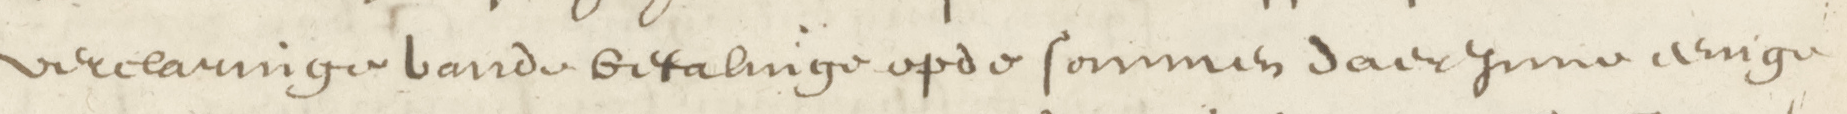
verclaringe vande betalinge opde sommen daer Inne eenige
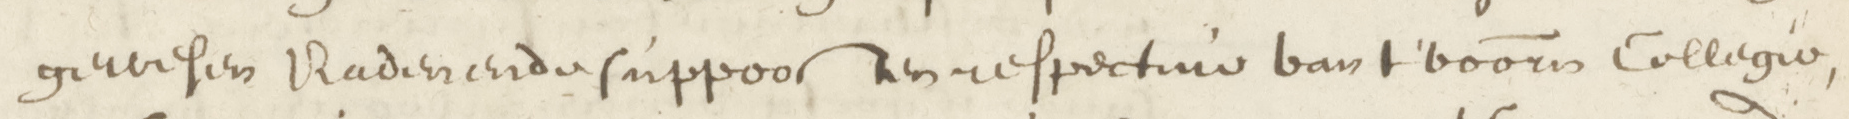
gewesen Raden ende suppoosten respectiue van t'voorn Collegie,
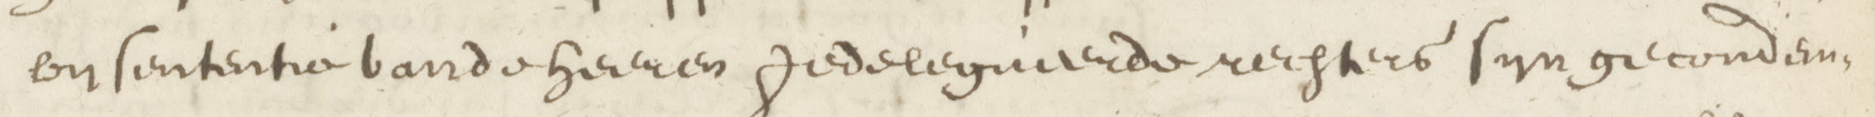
by sententie vande heeren gedelegueerde rechters syn gecondem,,
